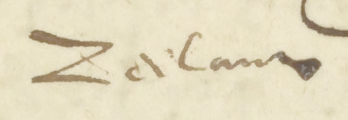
Zeelant
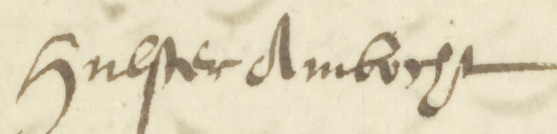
Hulster Ambocht
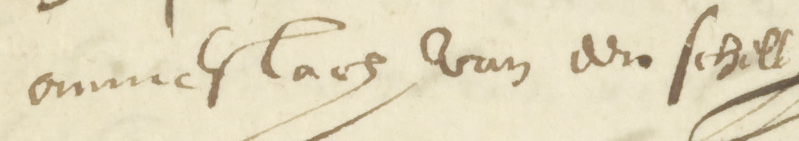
ommeslach van een schell
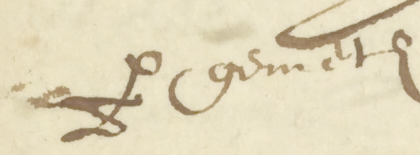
p gemeth
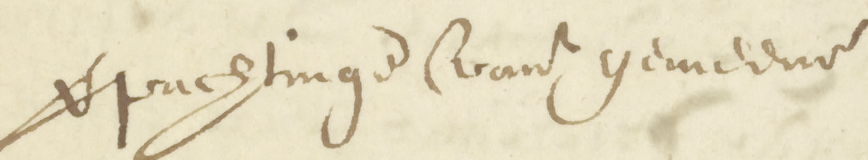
vpachtinge vant gemeene
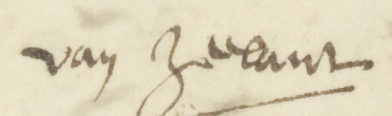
van Zeelant
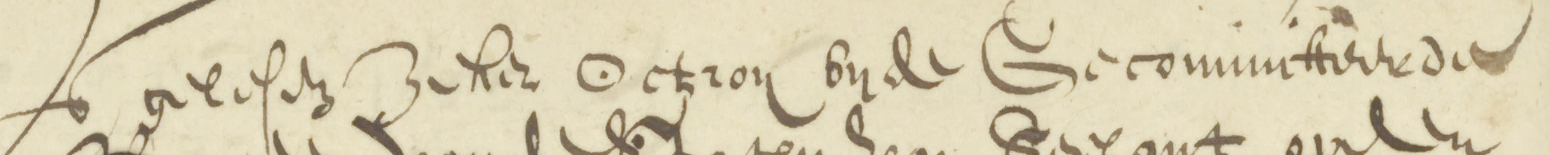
Is gelesen zeker octroy by de Gecommitteerde
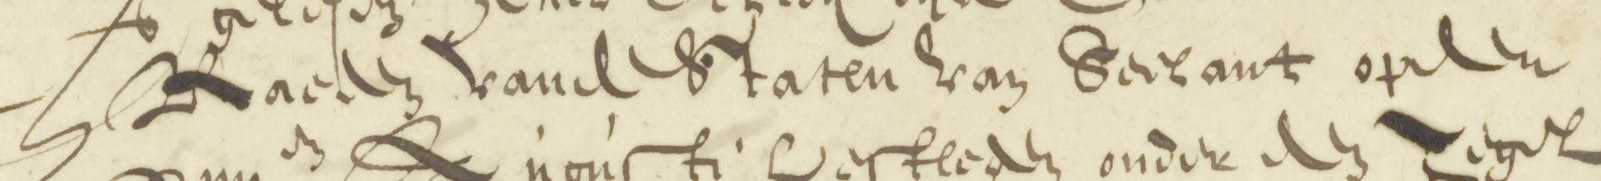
Raeden vande Staten van Seelant opden
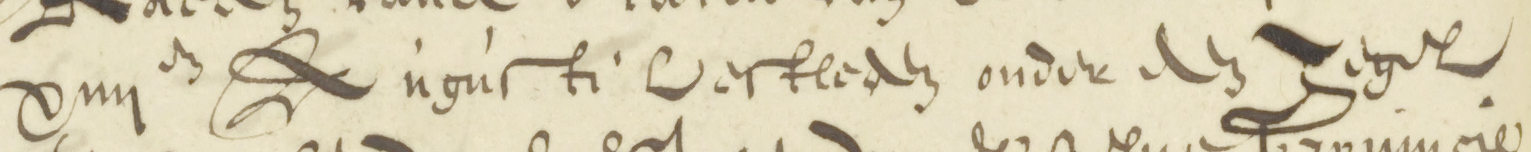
xiiijen Augusti lestleden onder den Zegel
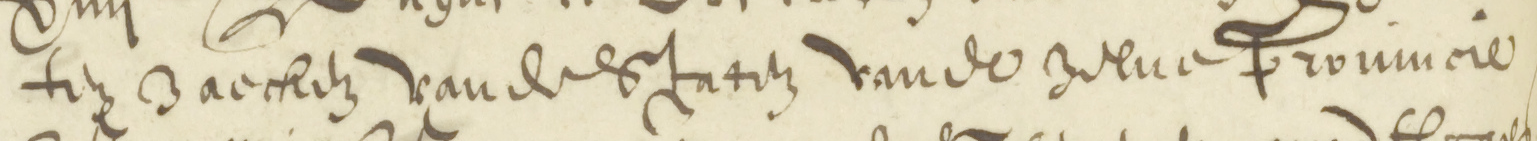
ten zaecken vande Staten vande zelue prouincie
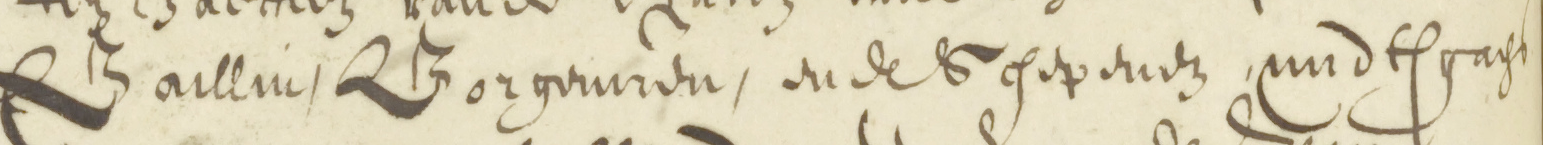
Bailliu, Borgemren, ende Schepenen, midtsgads
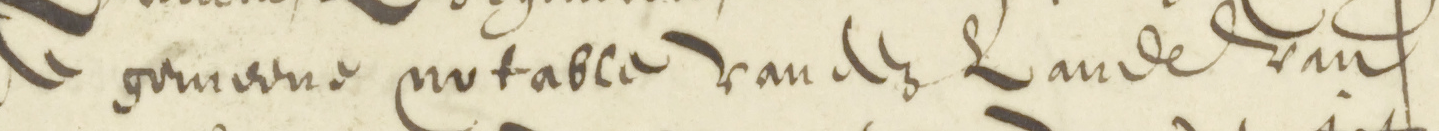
de gemeene notable vanden Lande van
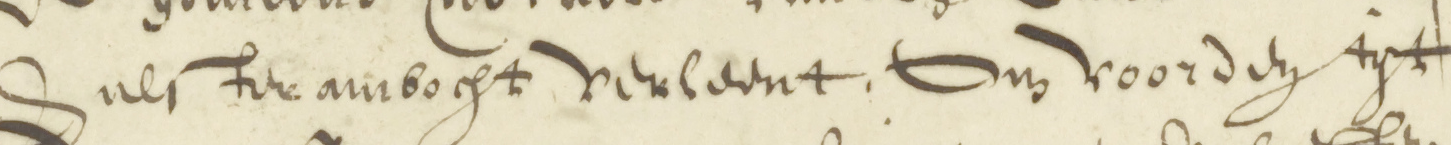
Hulsterambocht verleent, Om voorden tijt
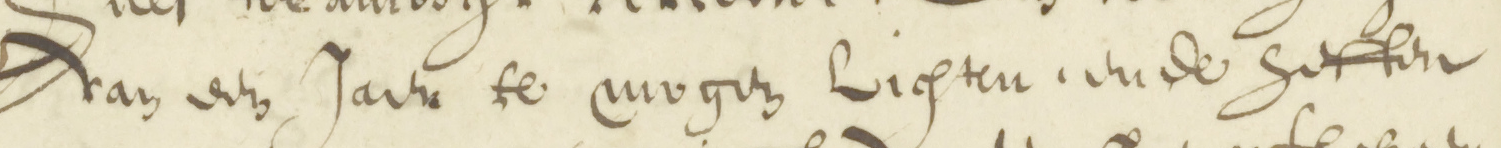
van een Jaer te mogen lichten, ende heffen
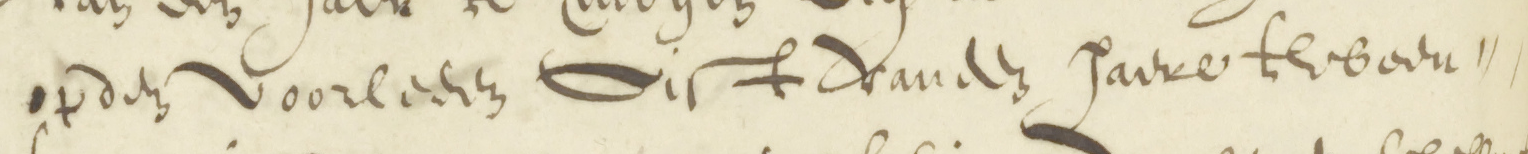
opden voorleden Oist van den Jaere tween„
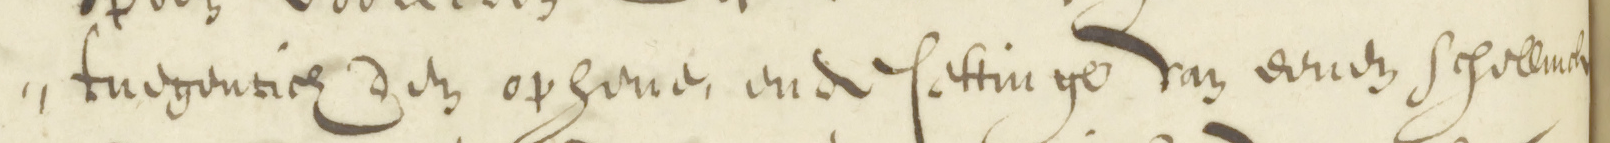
„tnegentich den opheue, ende settinge van eenen schellinck
